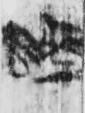陵
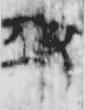攻
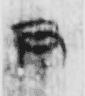尹
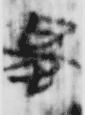快
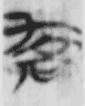喬
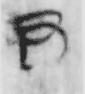尹
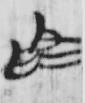爲
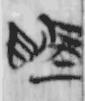陵
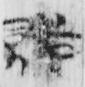貸
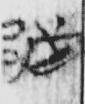○（越）
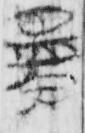異
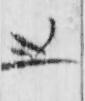之
